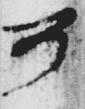乃
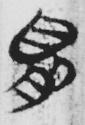{胃刀}（謂）
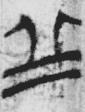丘
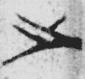之
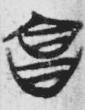合（答）
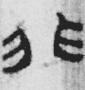非
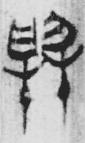與
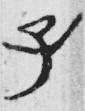子
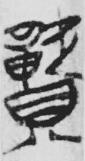贛
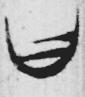曰
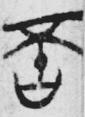否
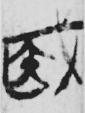○（繄）
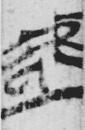○（吾）
